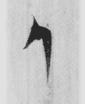人
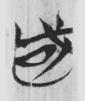或
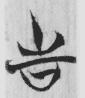告
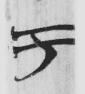于
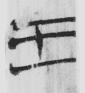王
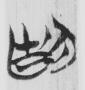廷
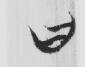曰
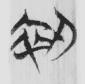初
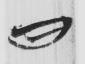日
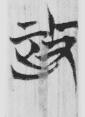政
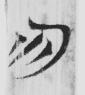勿
